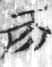戌
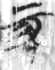亥
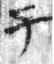子
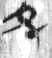丑
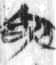寅
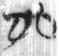卯
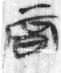晨
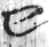巳
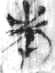未
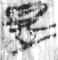是
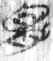{胃刀}（謂）
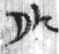外
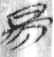昜（陽）
